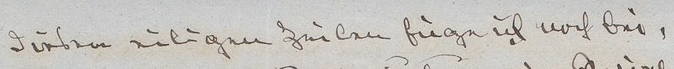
Diesen eiligen Zeilen füge ich noch bei,
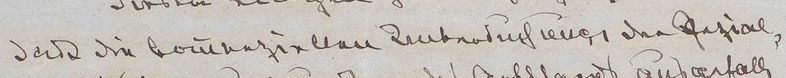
daß die kommerziellen Untersuchungen der Spezial-
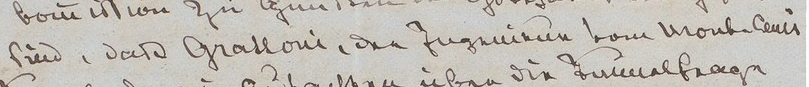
sind, dass Grattoni, der Ingenieur vom Mont-Cenis
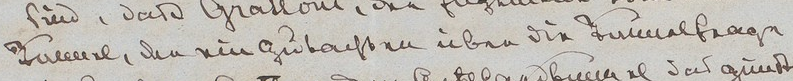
Tunnel, der ein Gutachten über die Tunnelfrage
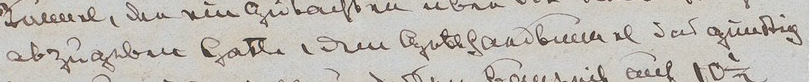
abzugeben hatte, dem Gotthardtunnel das günstig-
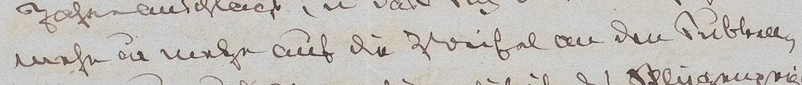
mehr u mehr auf die Zweifel an den Subven-
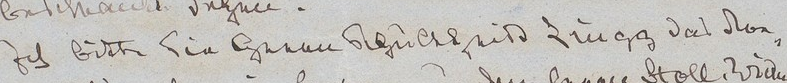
Ich bitte Sie Herrn Schultheiß Zingg das Vor-
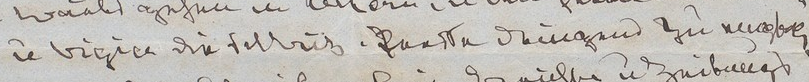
u Vigier die Schweiz. Presse dringend zu empfehlen.
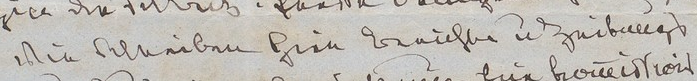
Wir schreiben hier Berichte u Zeitungs-
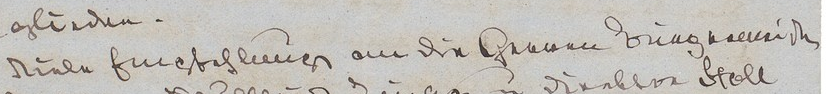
Meine Empfehlungen an die Herren Bürgermeister
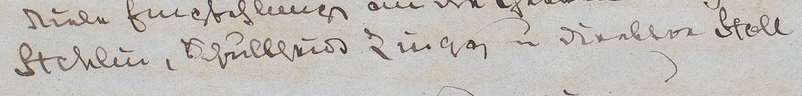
Stehlin, Schultheiß Zingg u Direktor Stoll
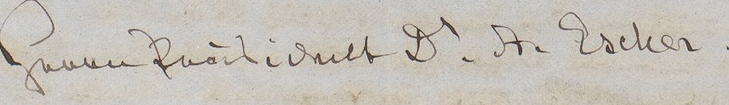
Herrn Präsident Dr A. Escher.
